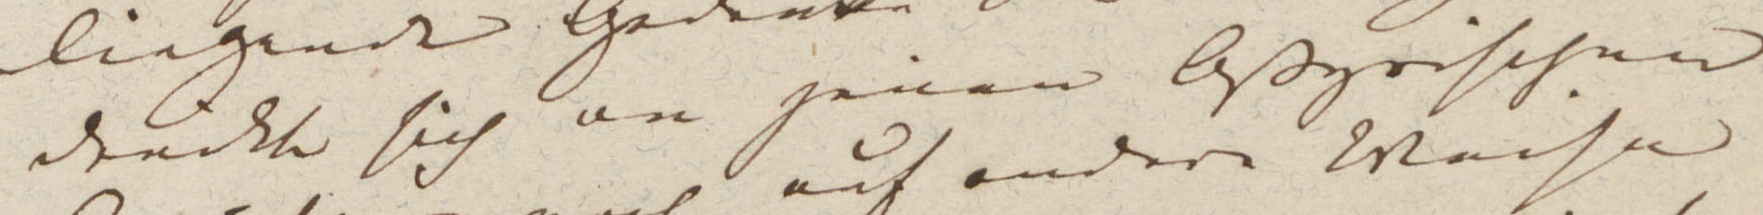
drückt sich an jenen Assyrischen
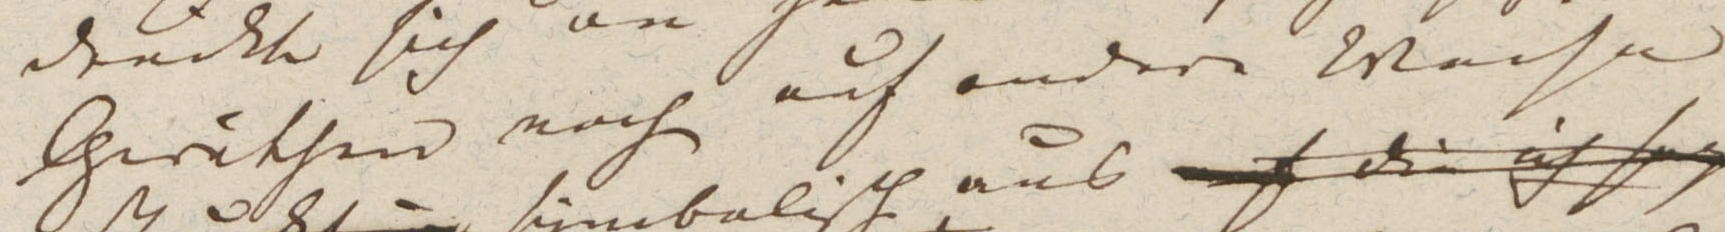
Geräthen noch auf andere Weise
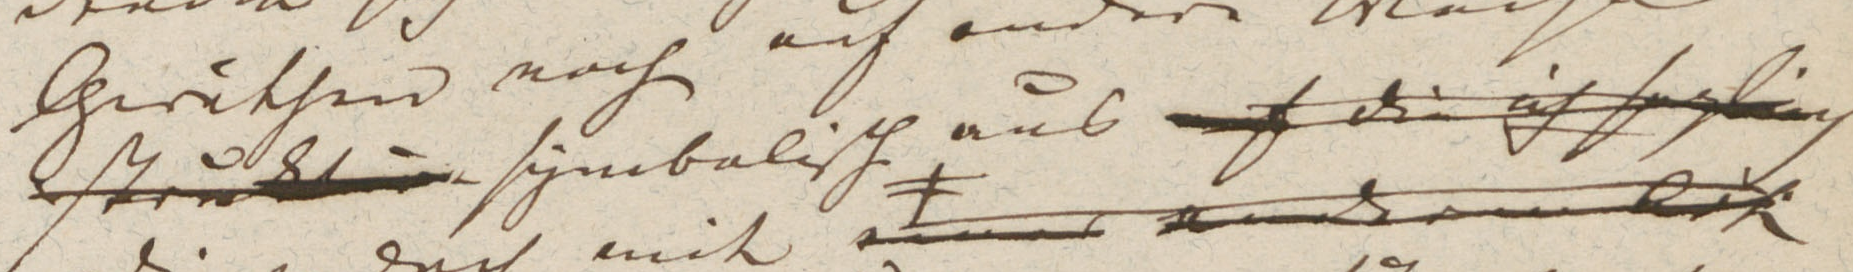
struktiv- symbolisch aus auf die ich sogleich
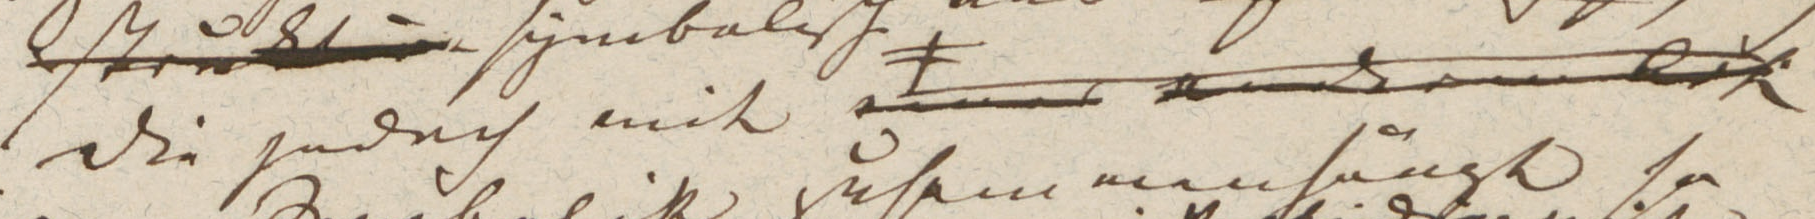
die jedoch mit einer anderen Art %
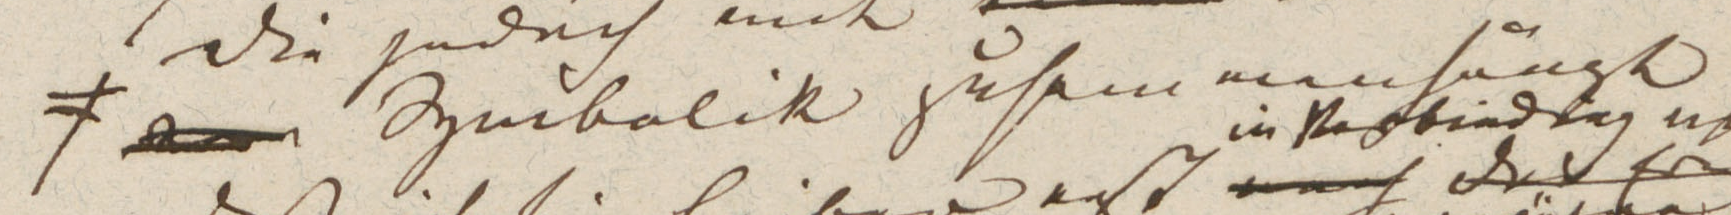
% von Symbolik zusammenhängt
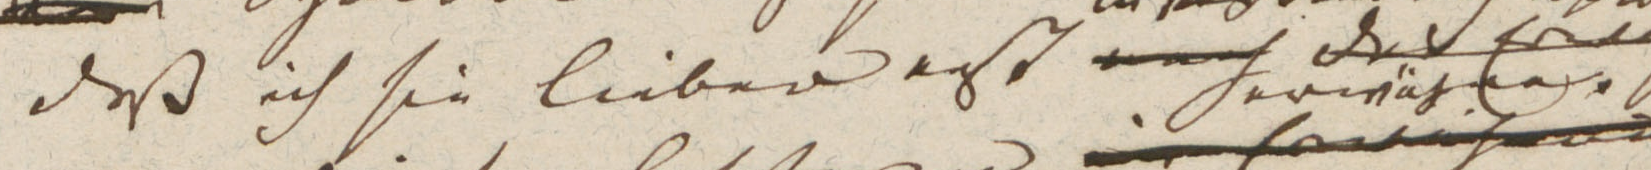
dass ich sie lieber erst nach in Verbindung
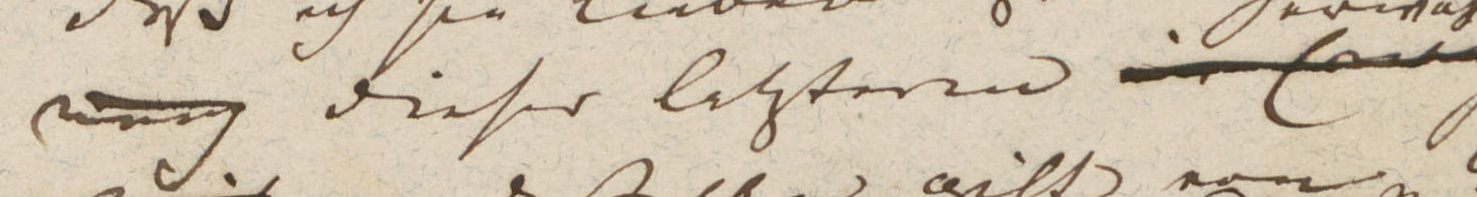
nung dieser letzteren in Erwähnung
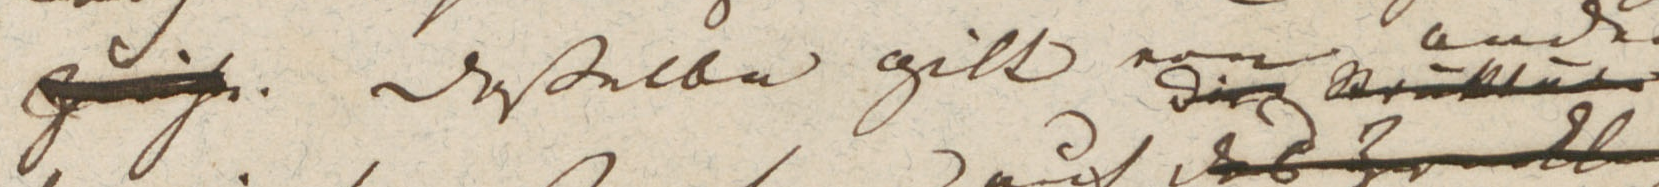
ziehe. Dasselbe gilt von anderen
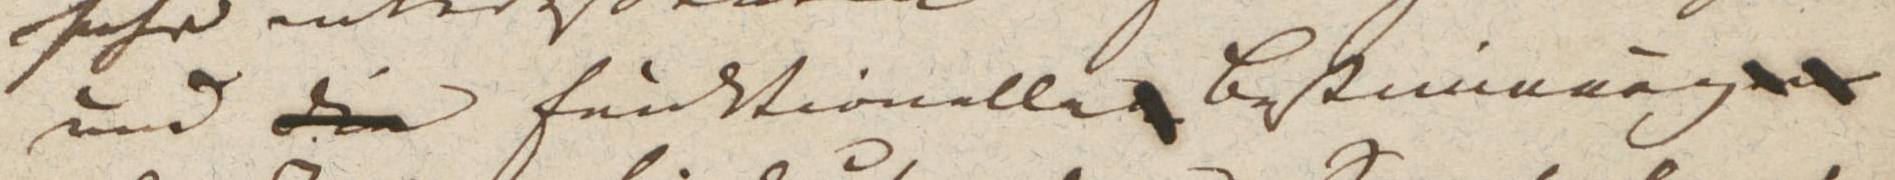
und die funktionellen Bestimmungen
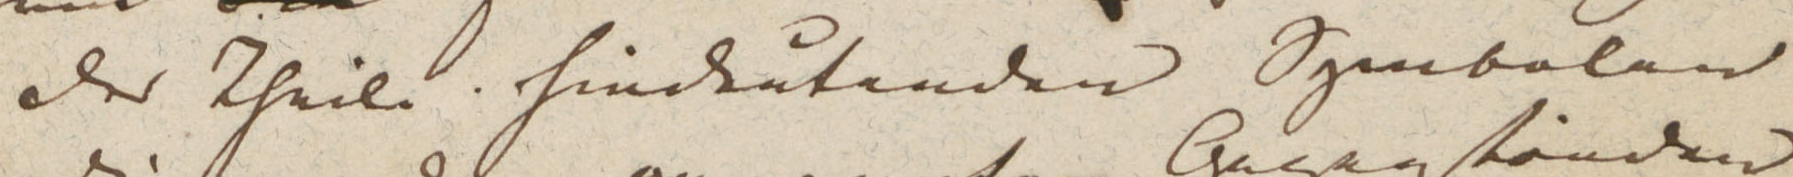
der Theile hindeutenden Symbolen
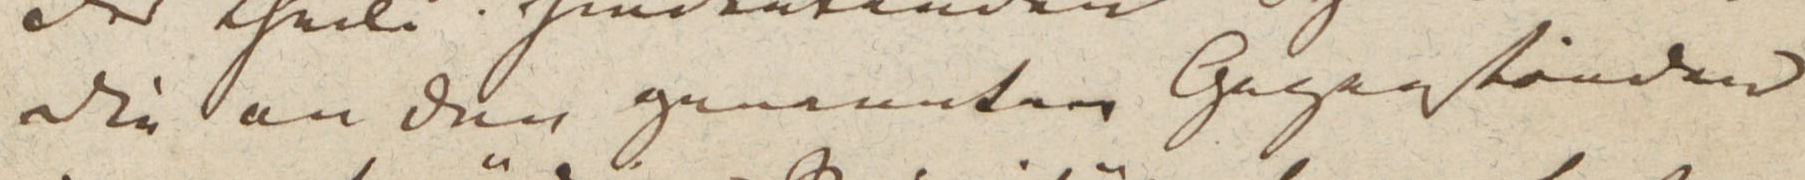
die an den genannten Gegenständen
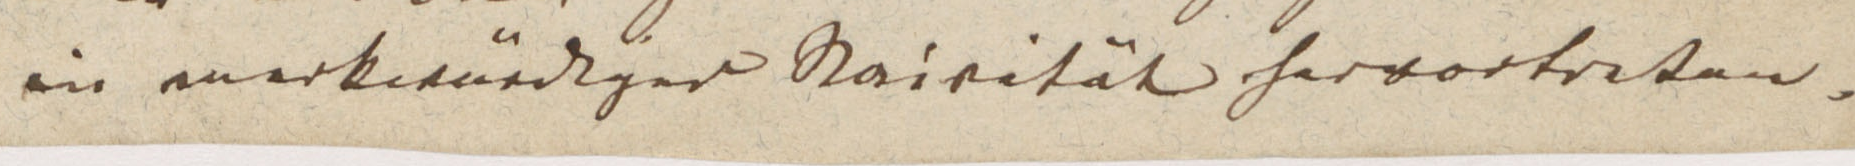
in merkwürdiger Naivität hervortreten.
